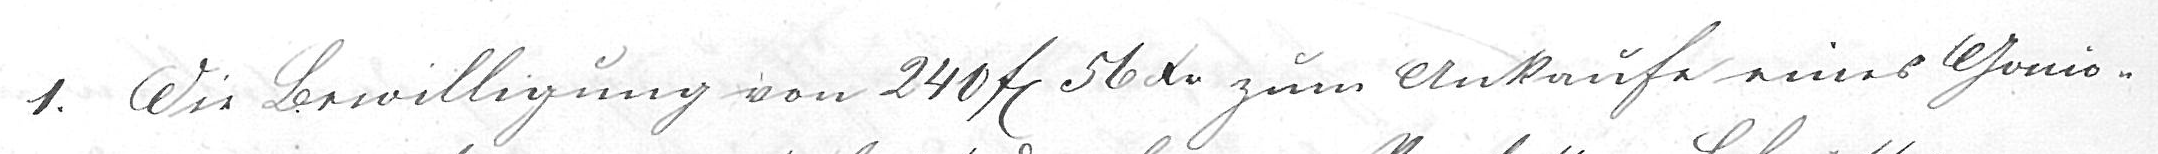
1. Die Bewilligung von 240 fl 56 Kr zum Ankaufe eines Gonio-
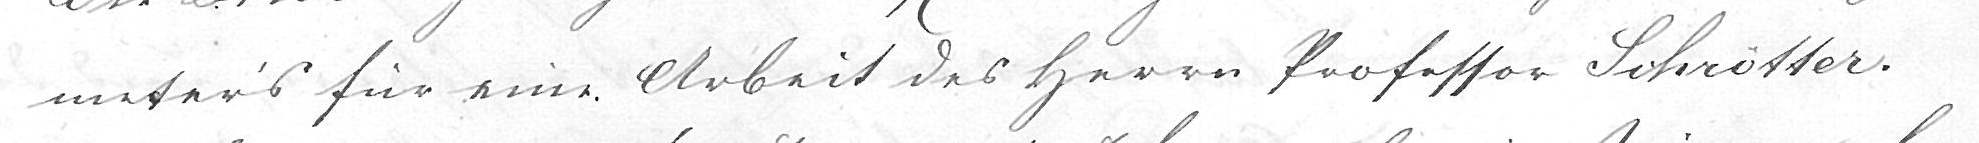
meters für eine Arbeit des Herrn Professor Schrötter.
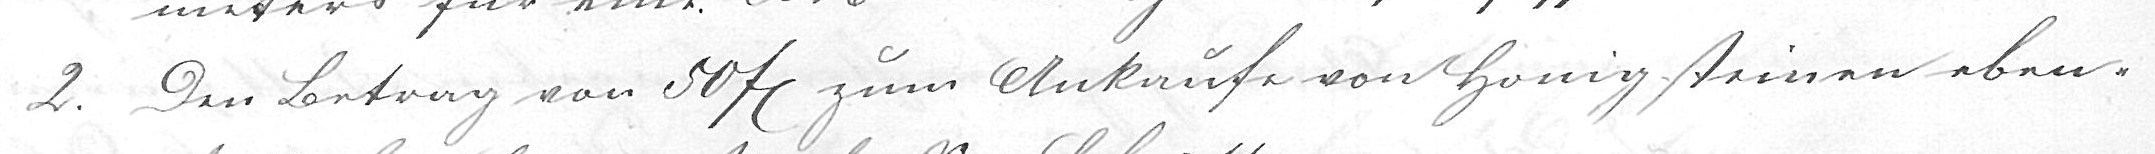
2. Den Betrag von 50 fl zum Ankauf von Honigsteinen eben-
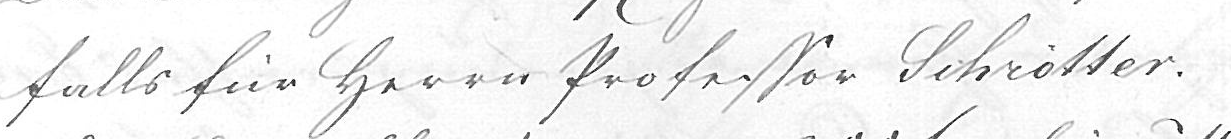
falls für Herrn Professor Schrötter.
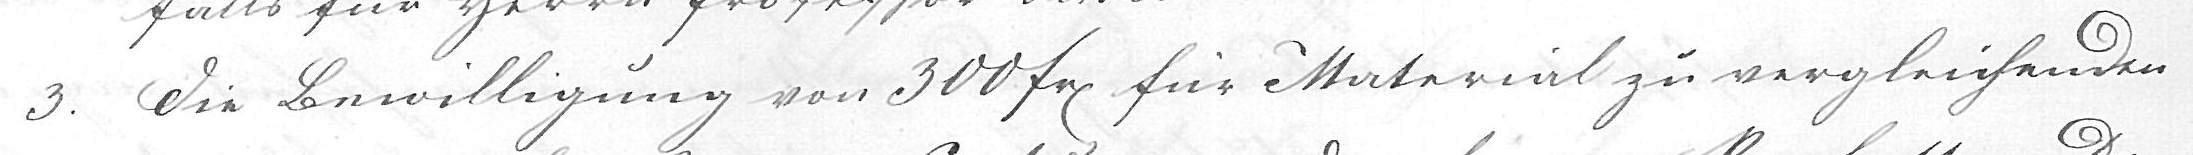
3. Die Bewilligung von 300 fr für Material zu vergleichenden
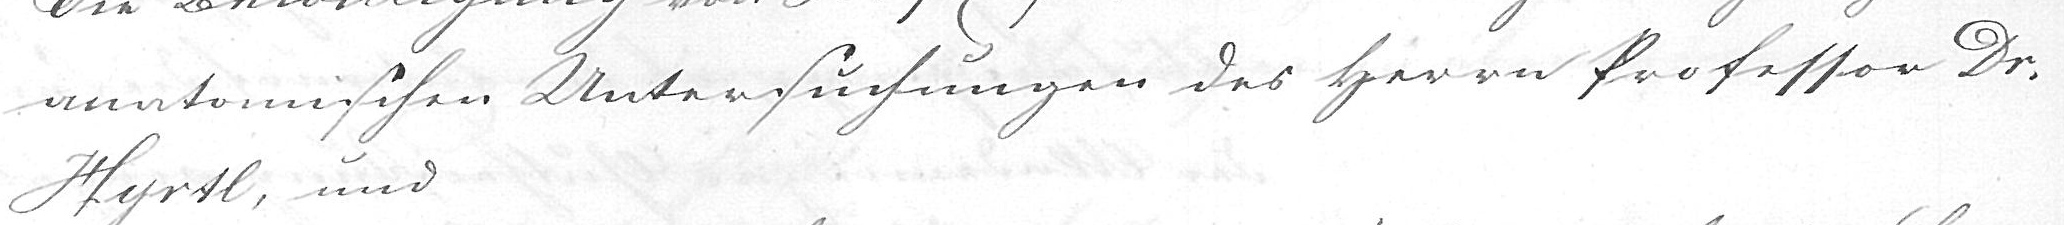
anatomischen Untersuchungen des Herrn Professor Dr.
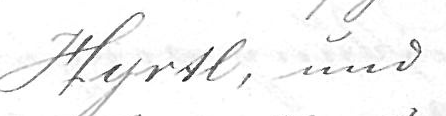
Hyrtl, und
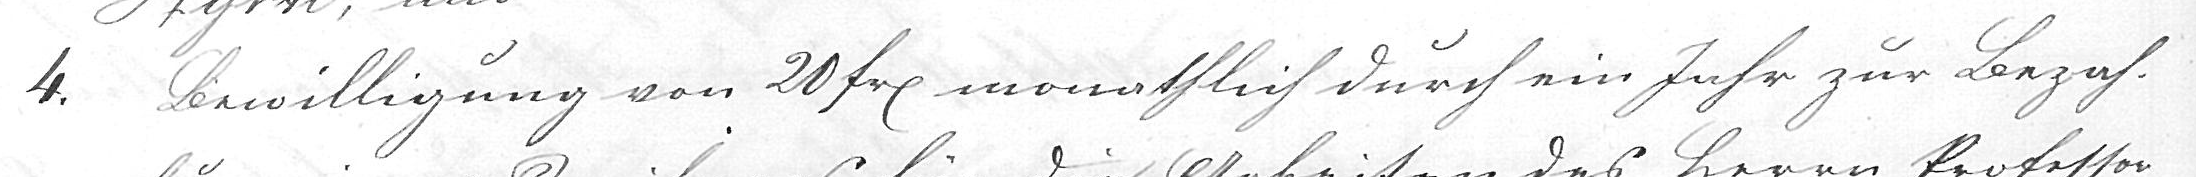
4. Bewilligung von 20 fr monatlich durch ein Jahr zur Bezah-
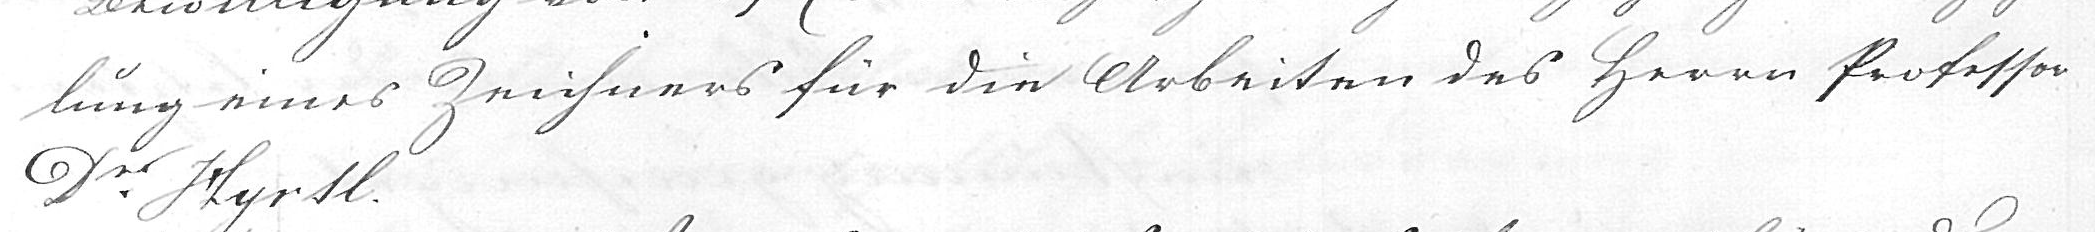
lung eines Zeichners für die Arbeiten des Herrn Professor
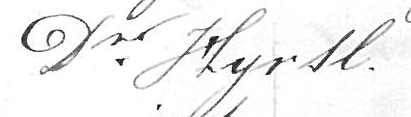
Dr. Hyrtl.
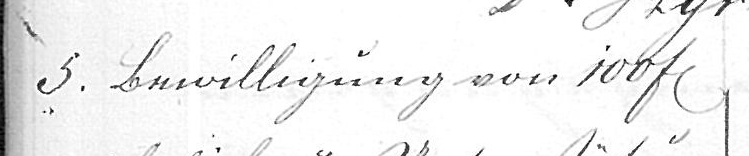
5. Bewilligung von 100 fl
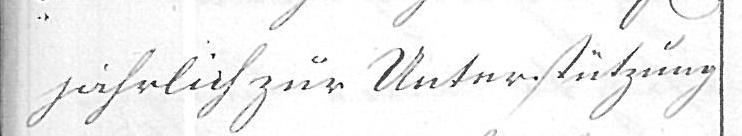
jährlich zur Unterstützung
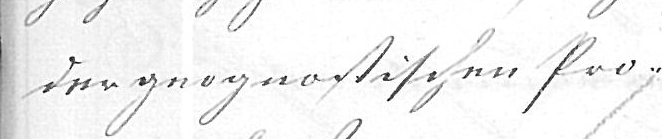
der geognostischen Pro-
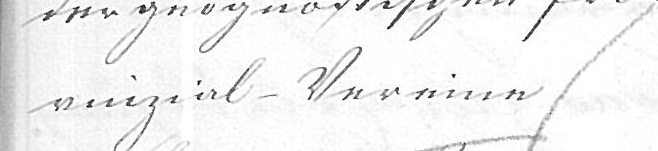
vinzial-Vereine
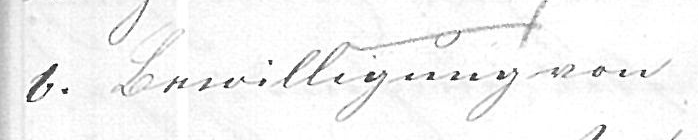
6. Bewilligung von
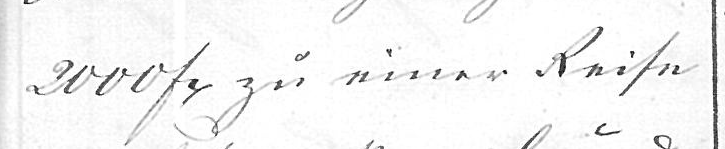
2000 fr zu einer Reise
